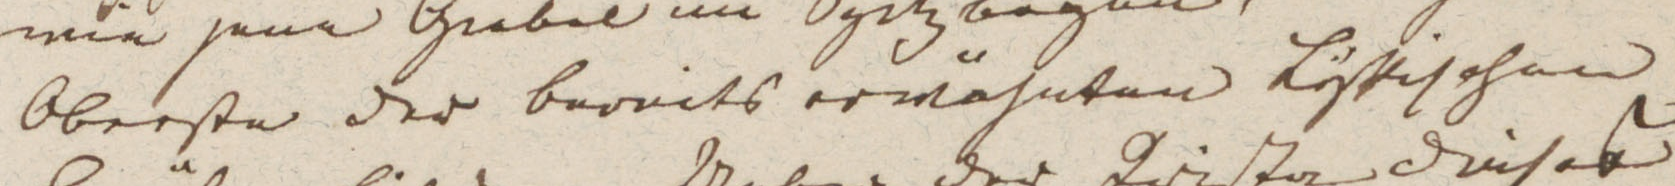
Oberste der bereits erwähnten Lykischen
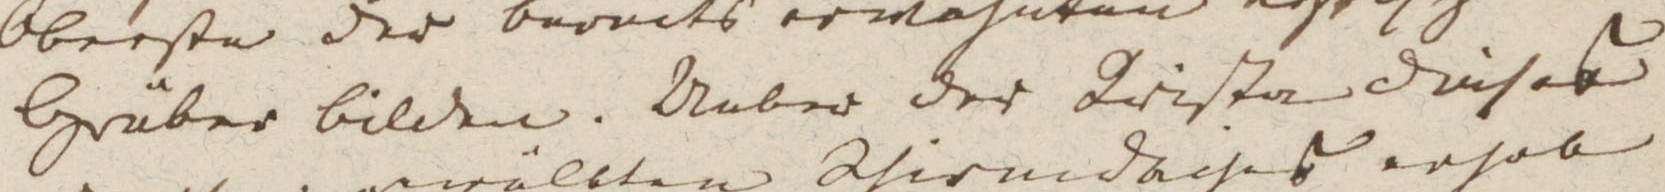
Gräber bilden. Ueber der Krista diesers
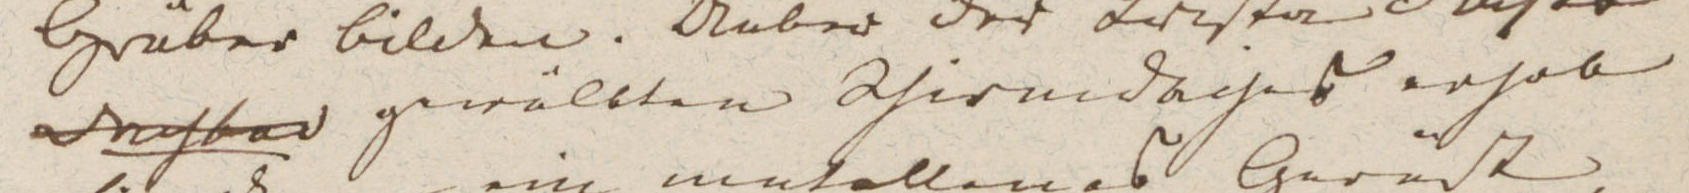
Dachb gewölbten Schirmdäachers erhob
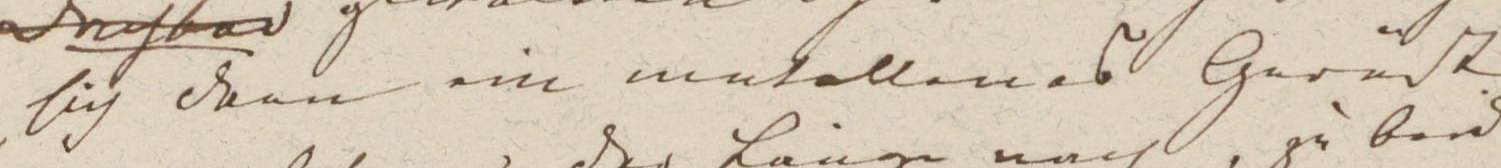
sich dann ein metallenes Gerüst,
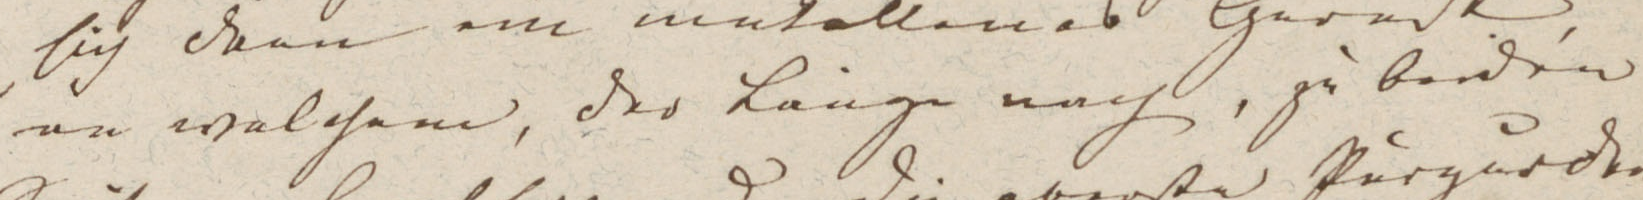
an welchem, der Länge nach, zu beiden
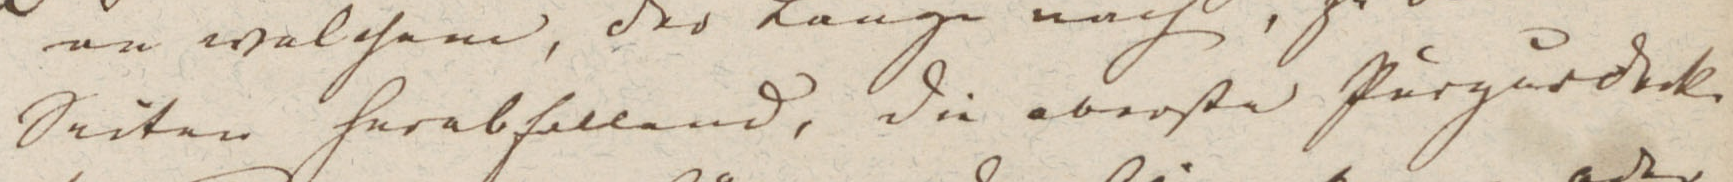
Seiten herabfallend, die oberste Purpurdecke
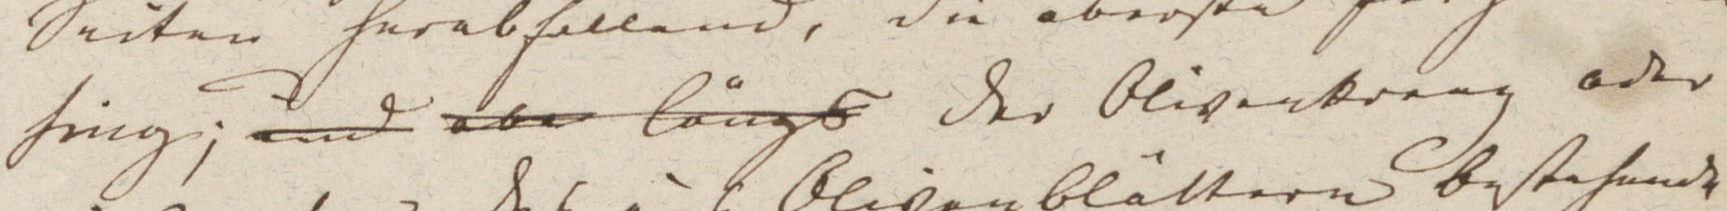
hing; und längs der Olivenkranz oder
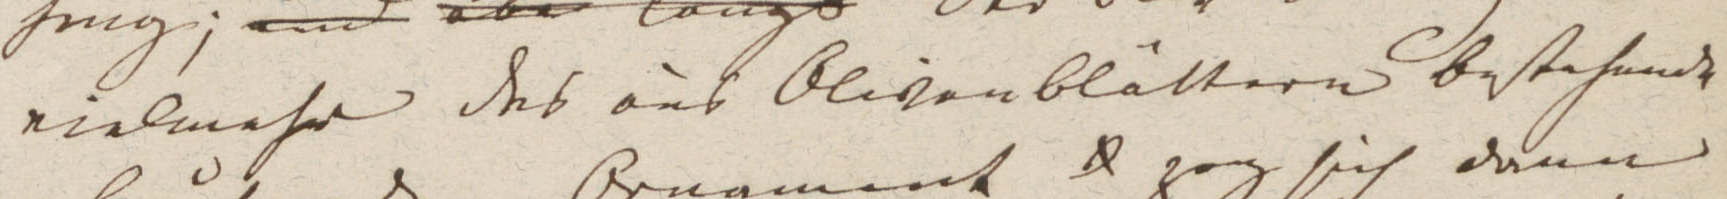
vielmehr das aus Olivenblättern bestehende
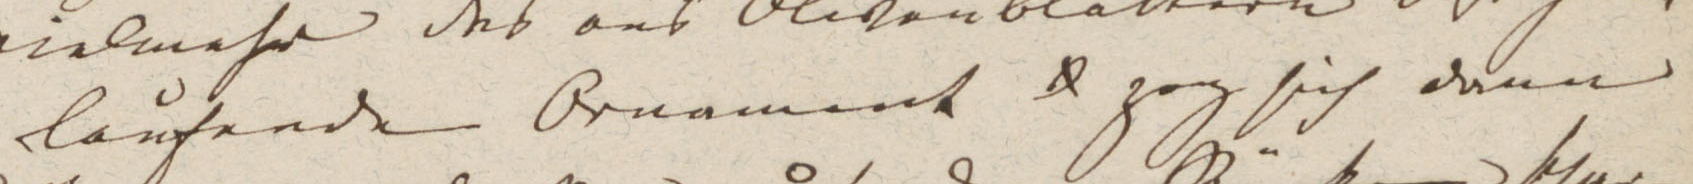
laufende Ornament zog sich dann
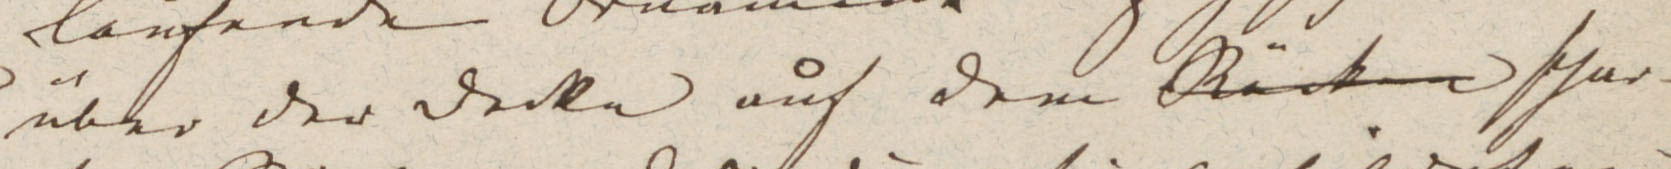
über der Decke auf dem Rücken schar-
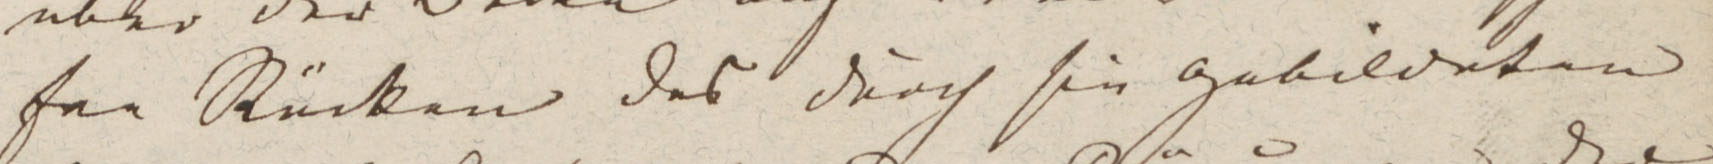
fen Rücken des durch sie gebildeten
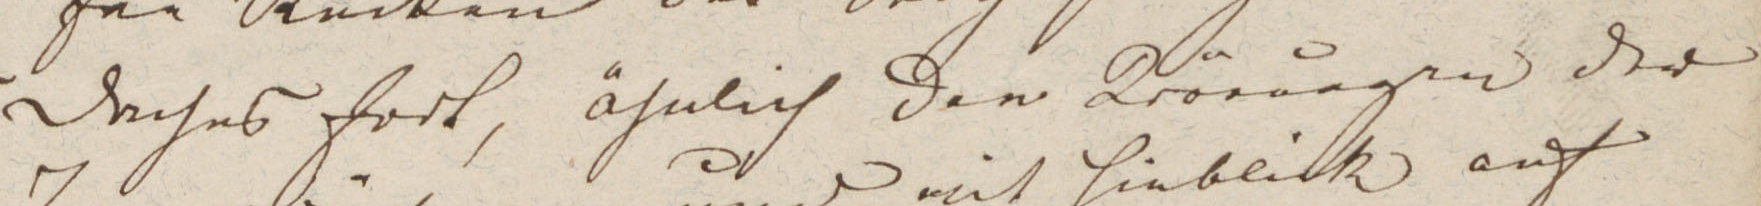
Daches fort, ähnlich den Krönungen der
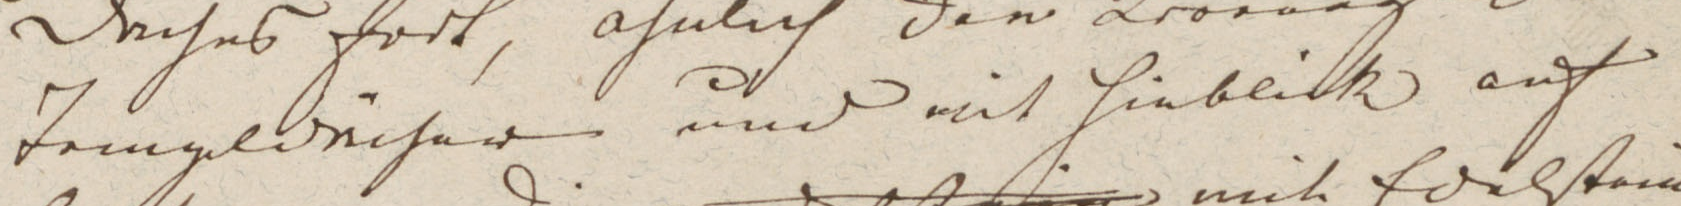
Tempeldächer und mit Hinblick auf
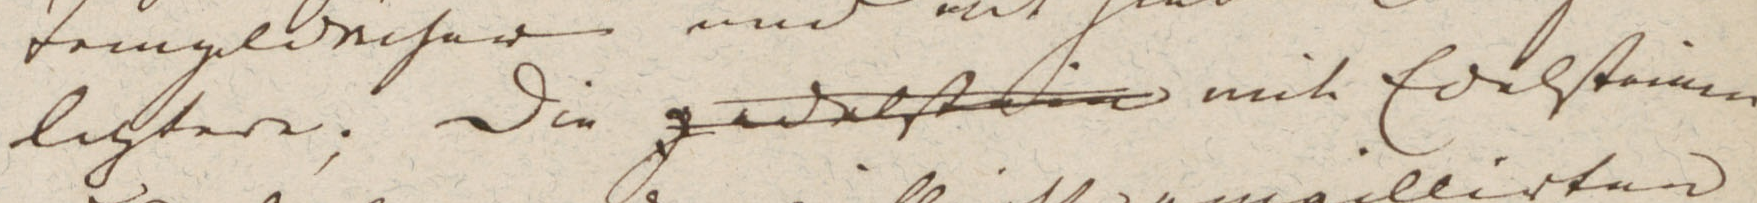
letztere; Die g edelstein mit Edelsteinen
